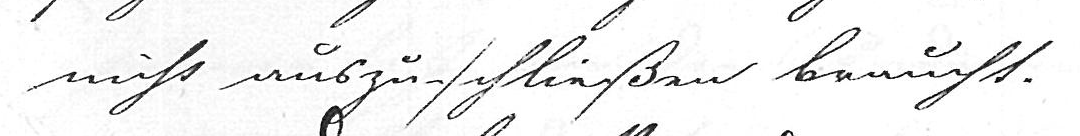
nicht auszuschließen braucht.
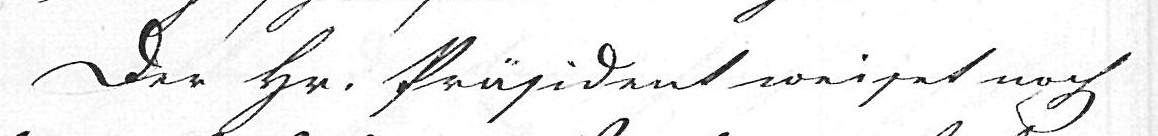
Der Hr. Präsident weiset noch
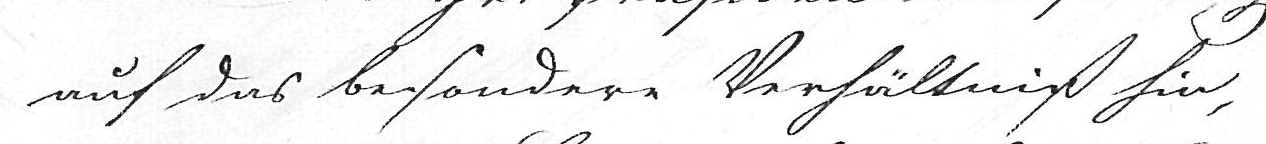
auf das besonderen Verhältniß hin,
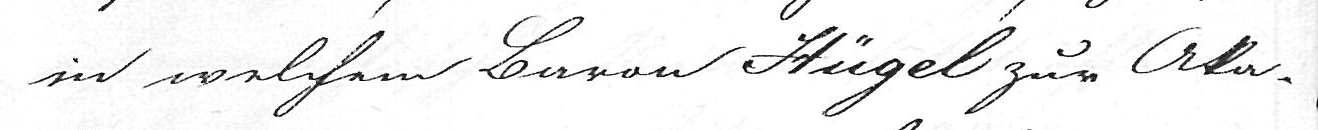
in welchem Baron Hügel zur Aka-
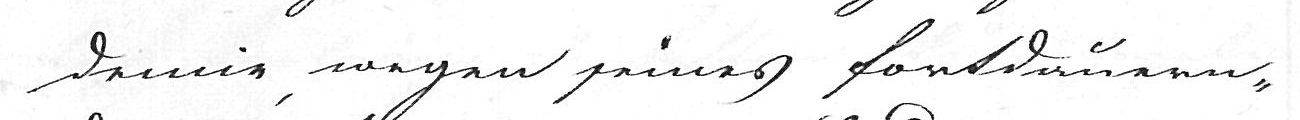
demie wegen seines fortdauern-
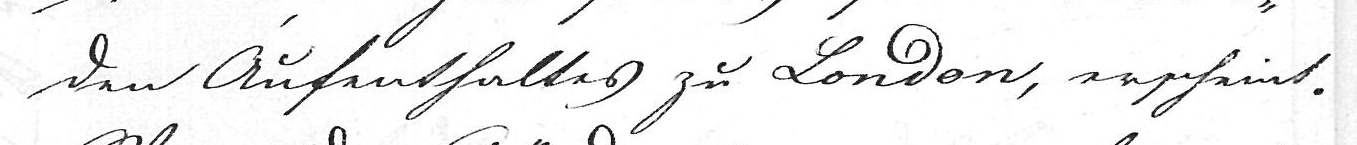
den Aufenthaltes zu London, erscheint.
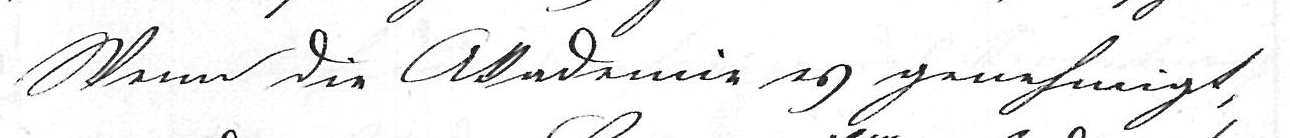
Wenn die Akademie es genehmigt,
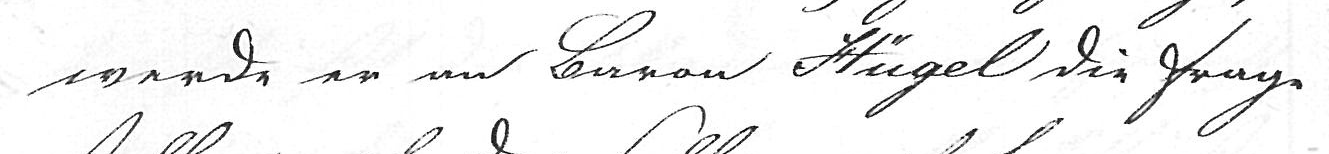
werde er an Baron Hügel die Frage
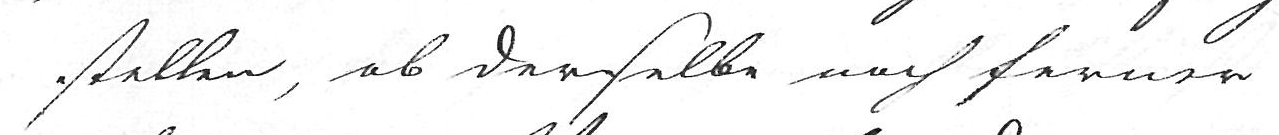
stellen, ob derselbe noch ferner
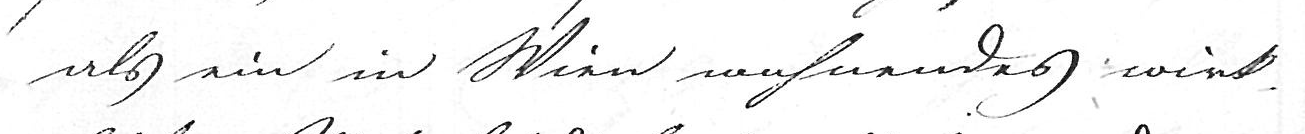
als ein in Wien wohnendes wirk-
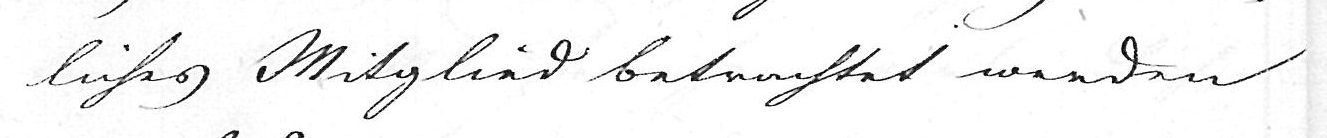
liches Mitglied betrachtet werden
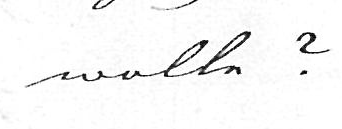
wolle?
